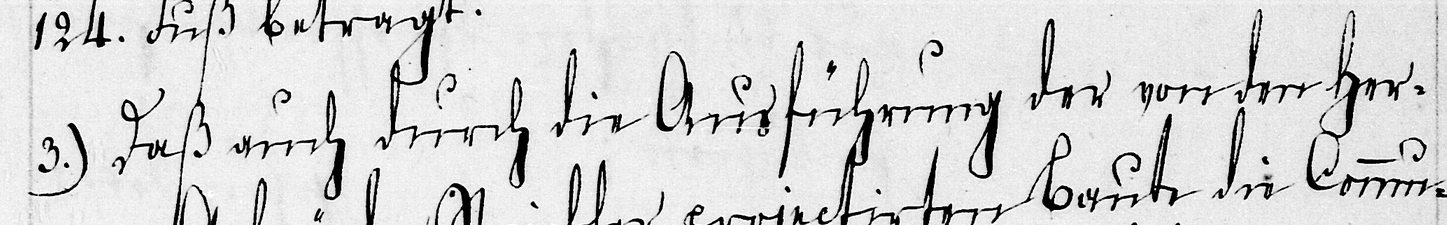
3.) Daß auch durch die Ausführung der von den Her¬
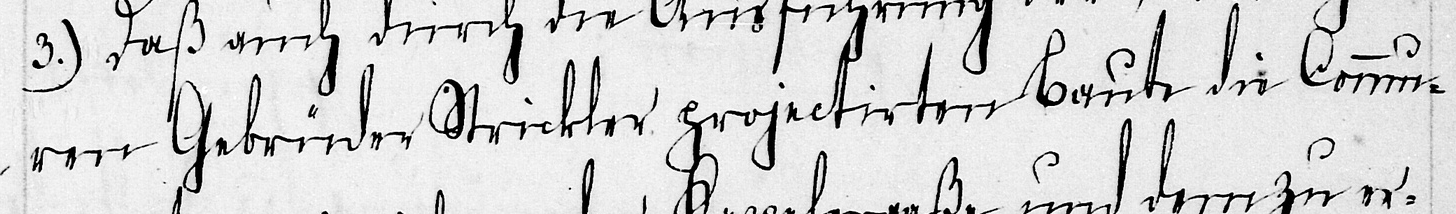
ren Gebrüder Strickler projectirten Baute die Commu¬
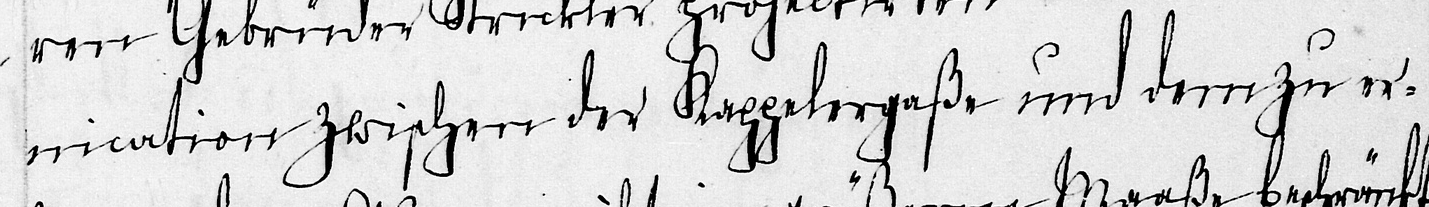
nication zwischen der Kappelergaße und dem zu er¬
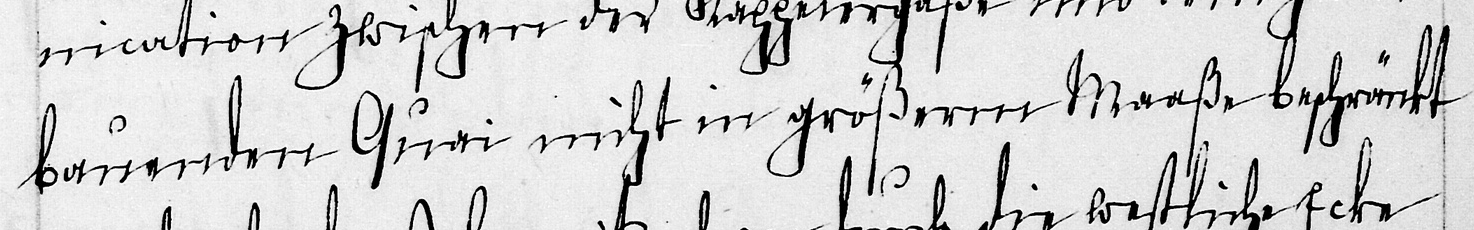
bauenden Quai nicht in größerm Maaße beschränkt
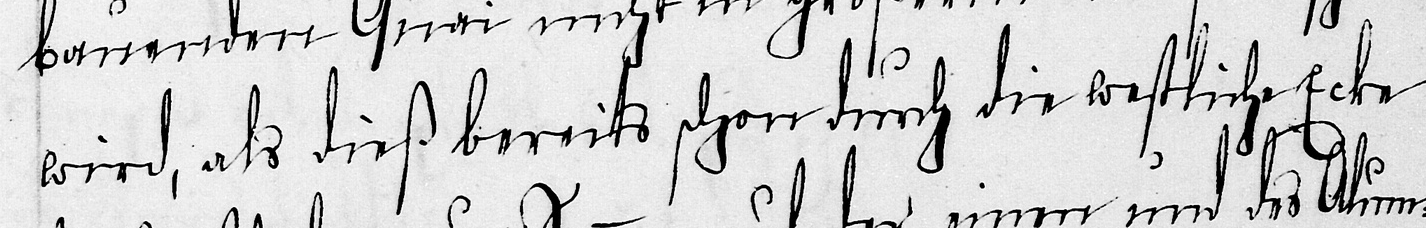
wird, als dieß bereits schon durch die westliche Ecke
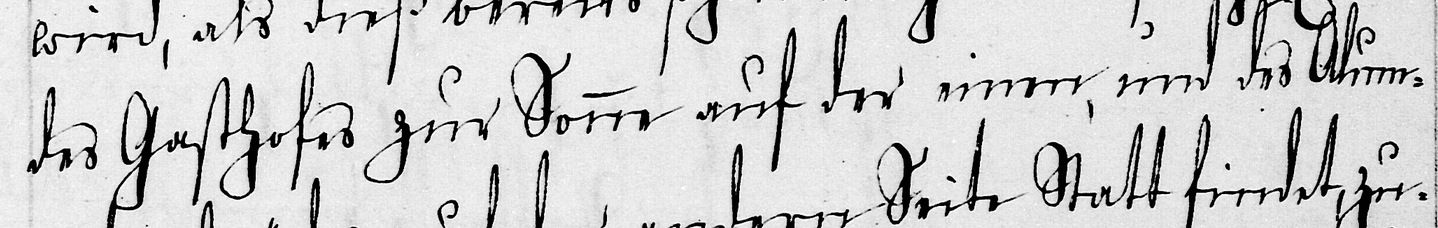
des Gasthofes zur Sonne auf der einen, und des Alum¬
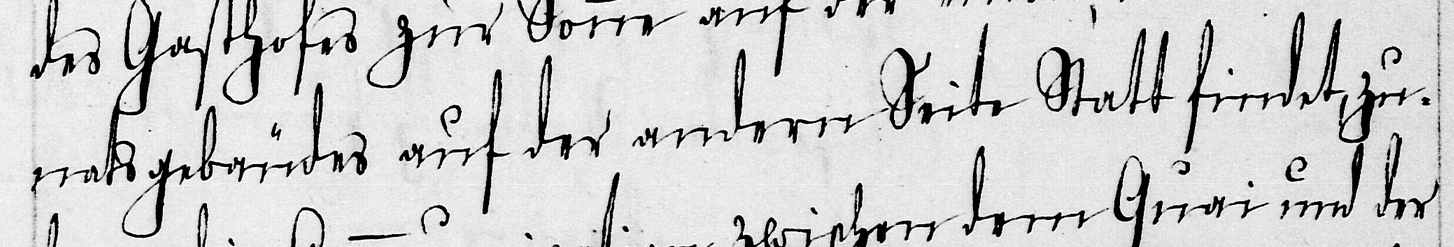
natsgebäude auf der andern Seite Statt findet, zu¬
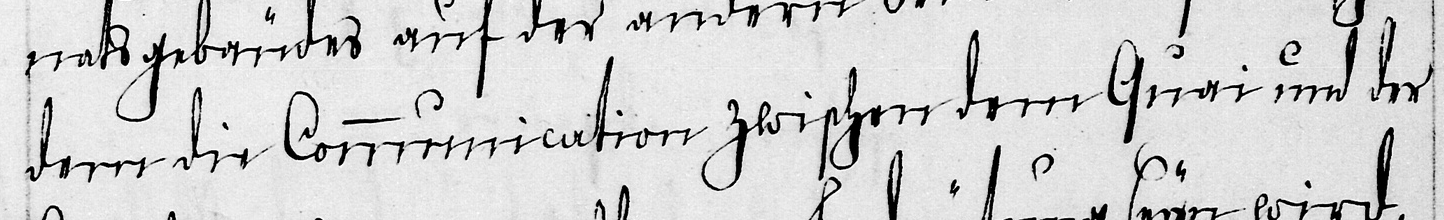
dem die Communication zwischen dem Quai und der
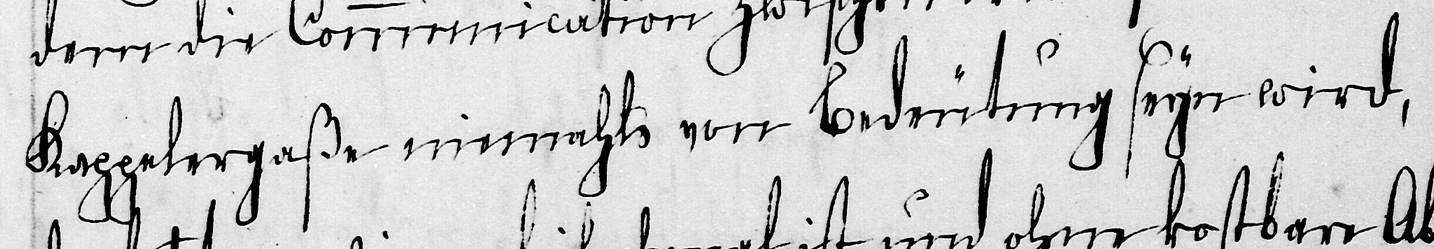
Kappelergaße niemahls von Bedeutung seyn wird,
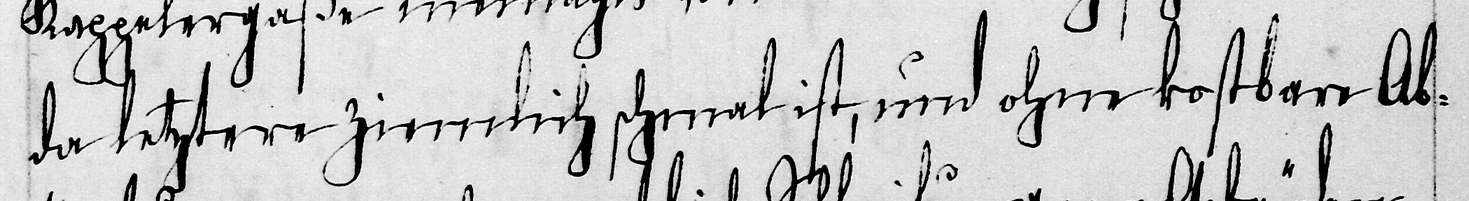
da letztere ziemlich schmal ist, und ohne kostbare Ab¬
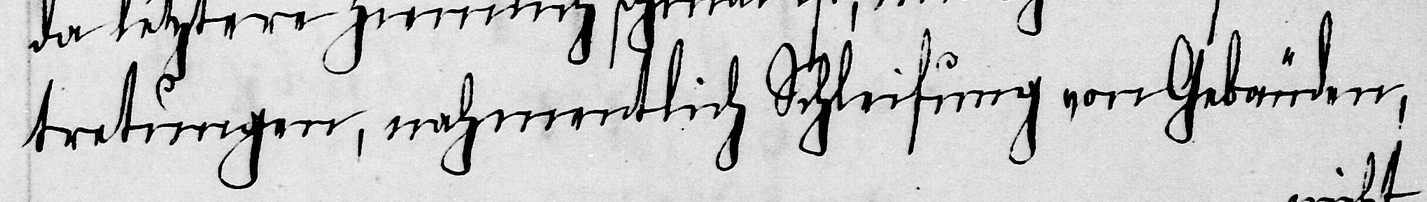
tretungen, nahmentlich Schleifung von Gebäuden,
